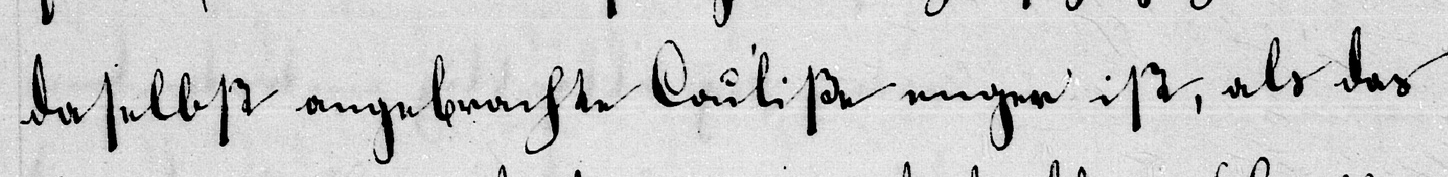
daselbst angebrachte Couliße enger ist, als das
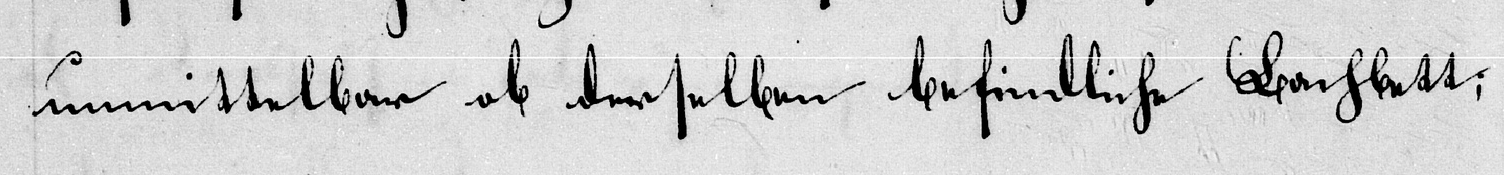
unmittelbar ob derselben befindliche Bachbett;
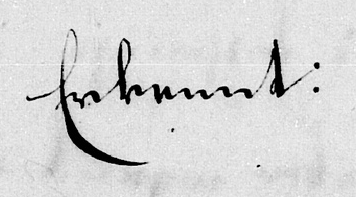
Erkennt:
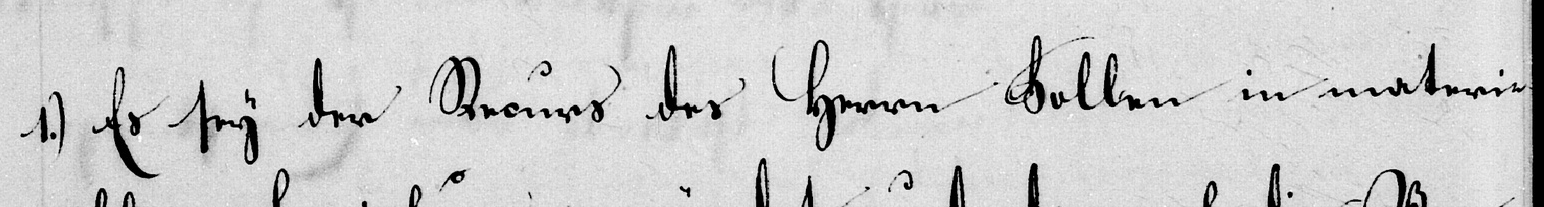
1.) Es sey der Recurs des Herrn Follen in materi¬
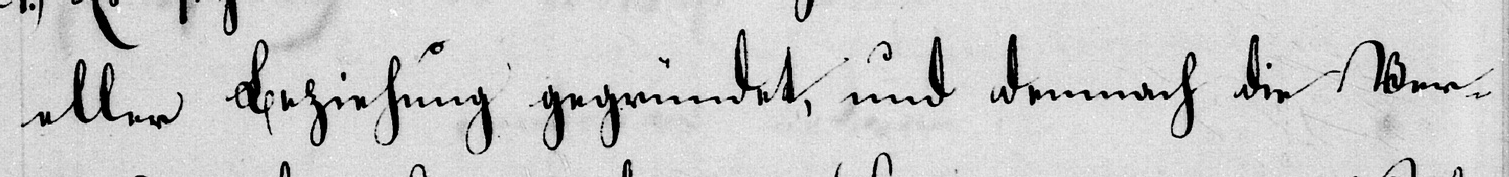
eller Beziehung gegründet, und demnach die Ver¬
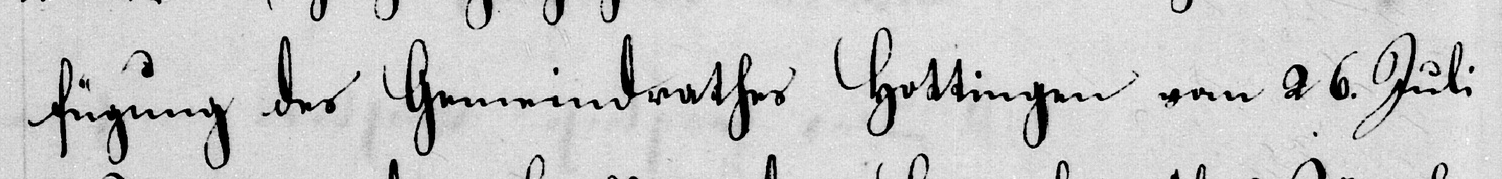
fügung des Gemeindrathes Hottingen vom 26. Juli
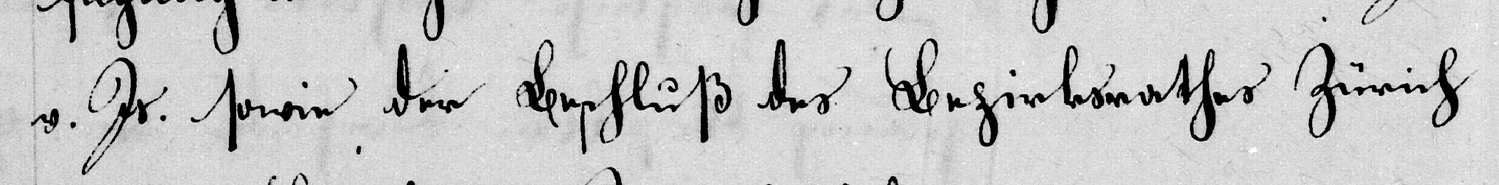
v. Js. sowie der Beschluß des Bezirksrathes Zürich
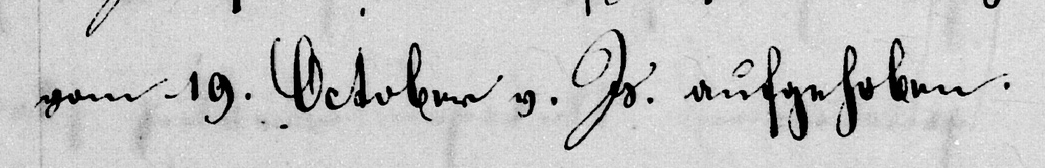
vom 19. October v. Js. aufgehoben.
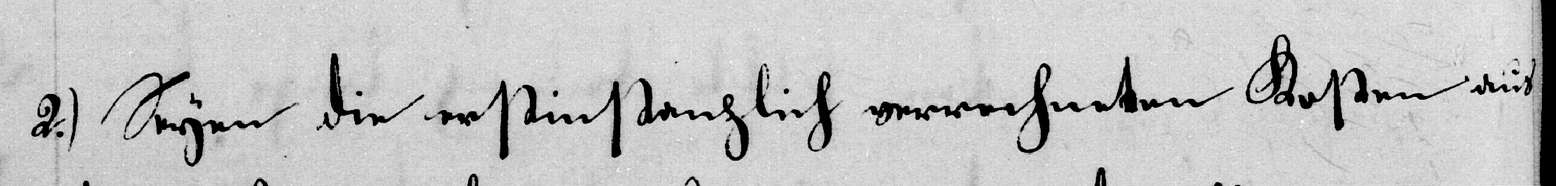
2.) Seyen die erstinstanzlich verrechneten Kosten aus
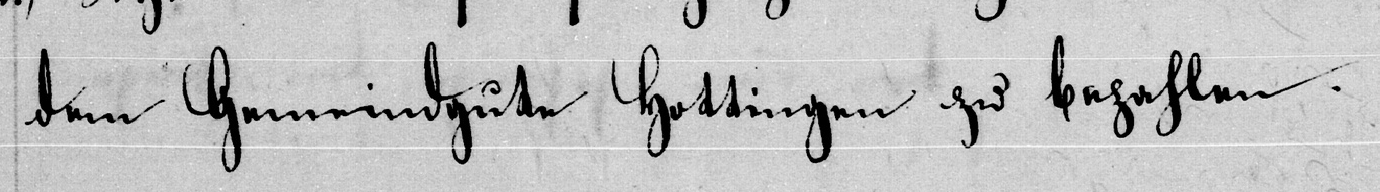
dem Gemeindgute Hottingen zu bezahlen.
